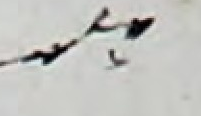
do
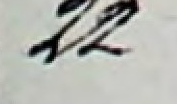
22
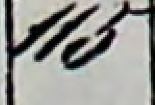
115
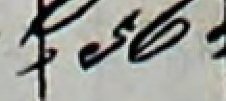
0,56
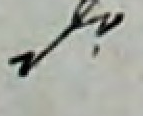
do
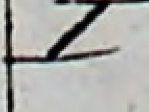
I
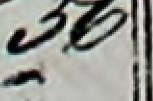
56
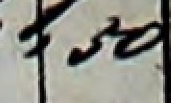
1,50
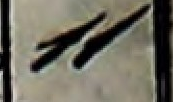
11
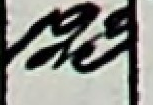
123
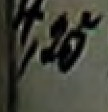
4,25
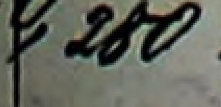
0,280
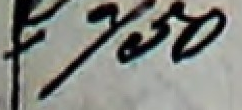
0,750
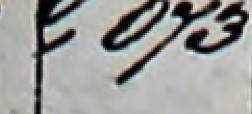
0,073
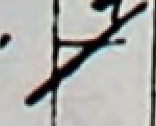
7
